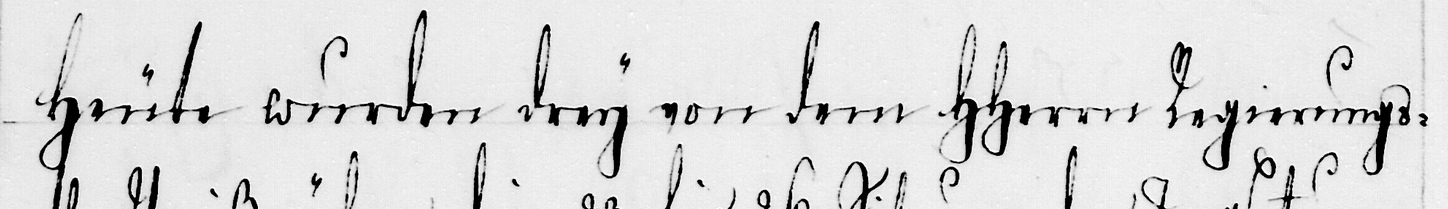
Heute wurden drey von dem HHerrn Regierungs¬
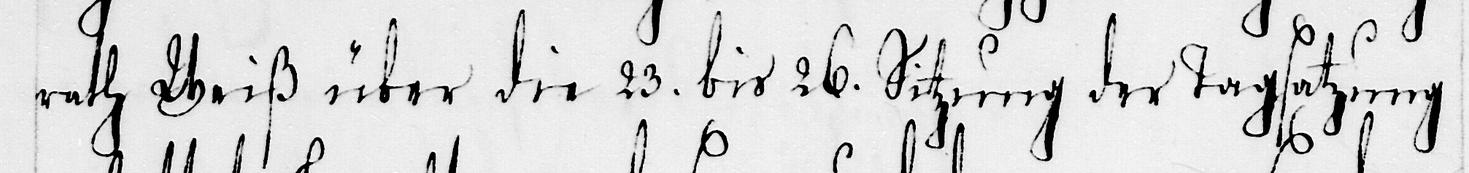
rath Weiß über die 23. bis 26. Sitzung der Tagsatzung
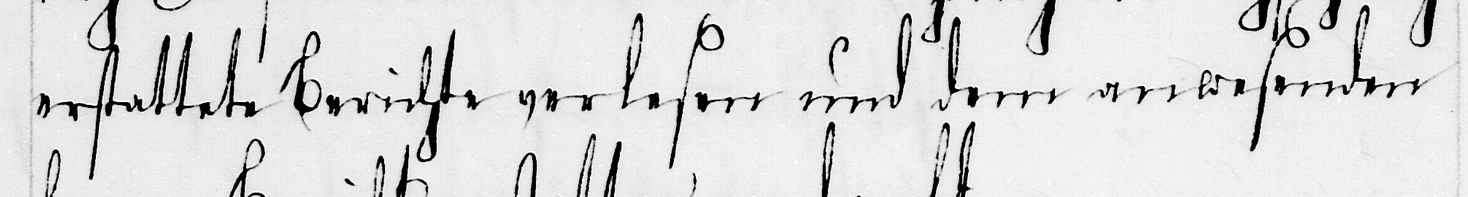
erstattete Berichte verlesen und dem anwesenden
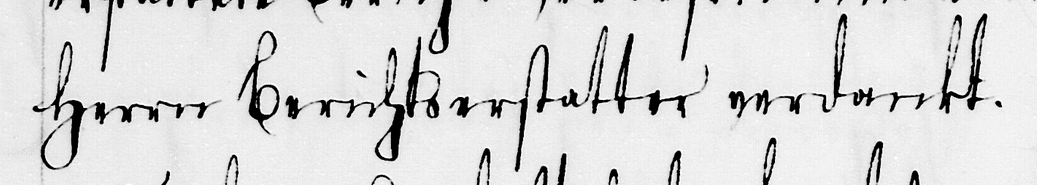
Herrn Berichtserstatter verdankt.
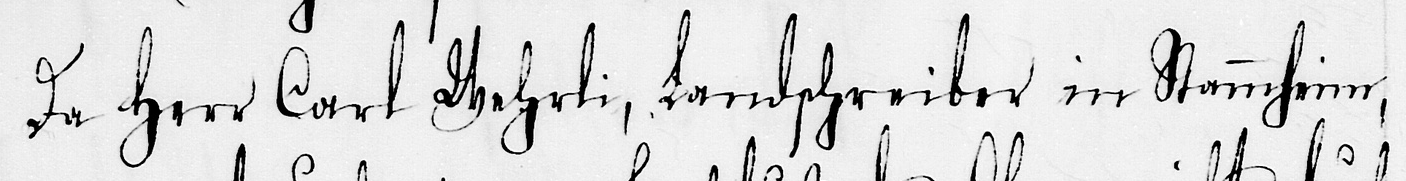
Da Herr Carl Wehrli, Landschreiber in Stammheim,
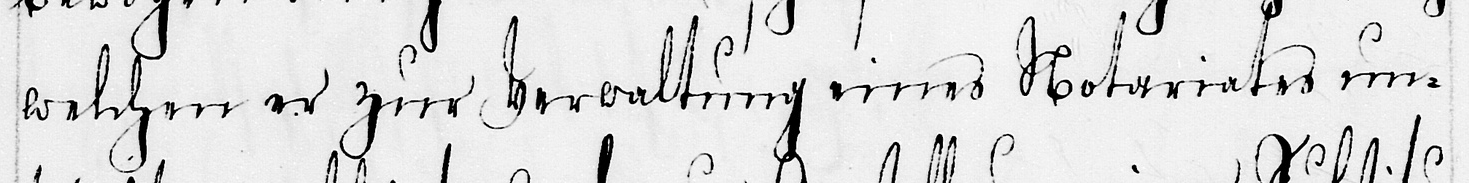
welchen er zur Verwaltung eines Notariates un¬
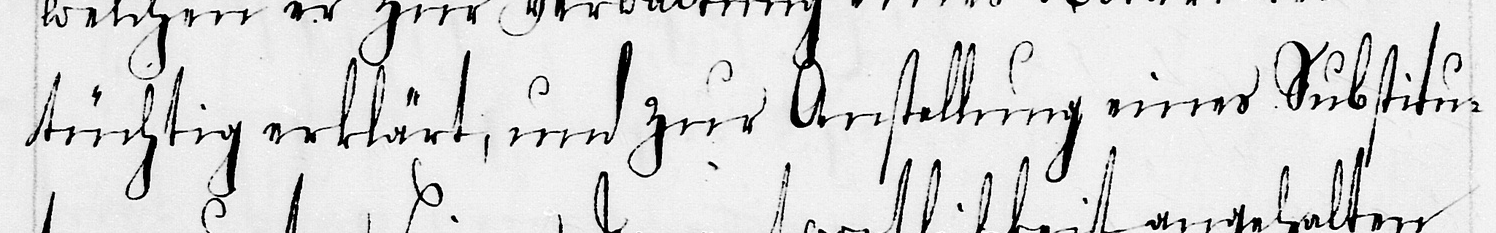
tüchtig erklärt, und zur Anstellung eines Substitu¬
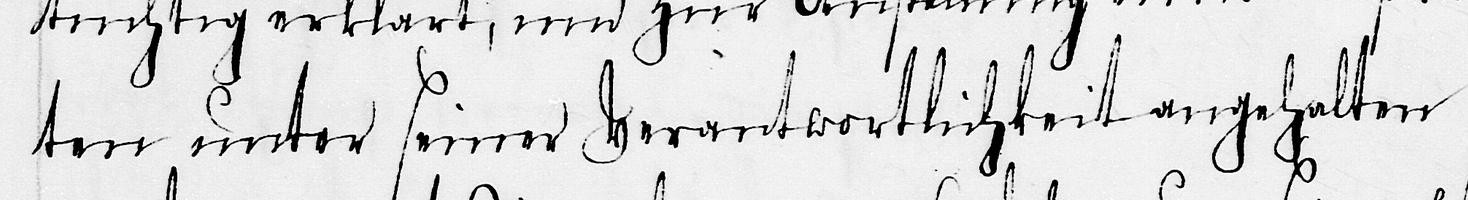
ten unter seiner Verantwortlichkeit angehalten
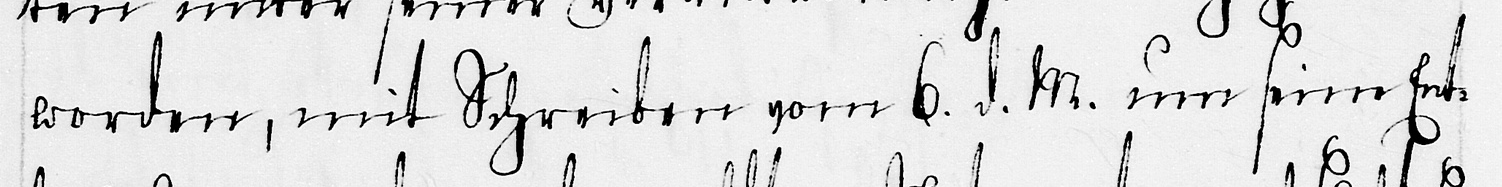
worden, mit Schreiben vom 6. d. M. um seine Ent¬
